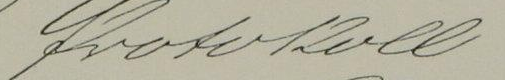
Protokoll
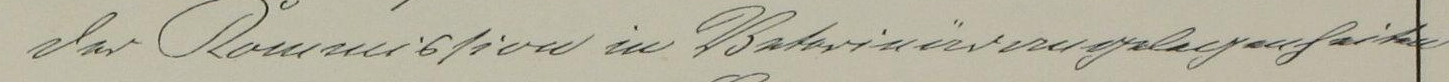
der Kommission in Veterinärangelegenheiten
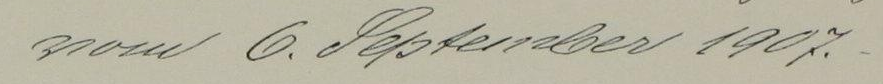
vom 6. September 1907.
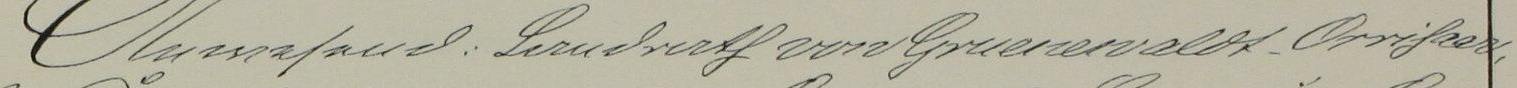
Anwesend: Landrath von Gruenewaldt-Orrisaar,
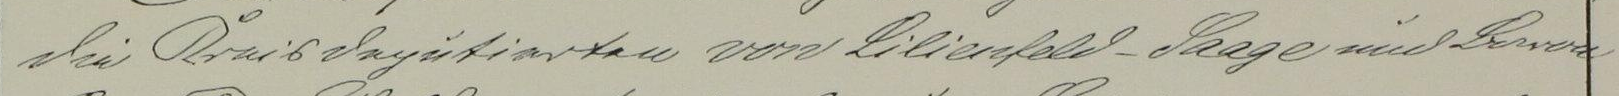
die Kreisdeputierten von Lilienfeld-Saage und Baron
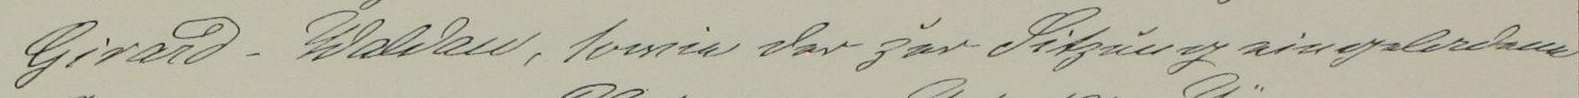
Girard-Waldau, sowie der zur Sitzung eingeladene
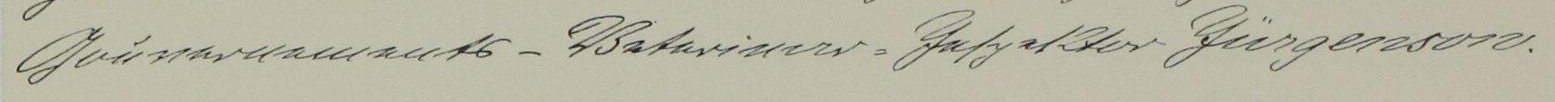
Gouvernements-Veterinar-Inspektor Jürgenson.
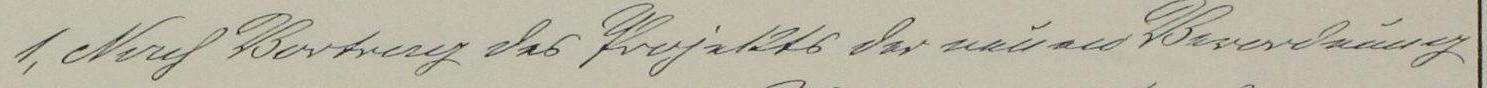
1. Nach Vortrag des Projekts der neuen Verordnung
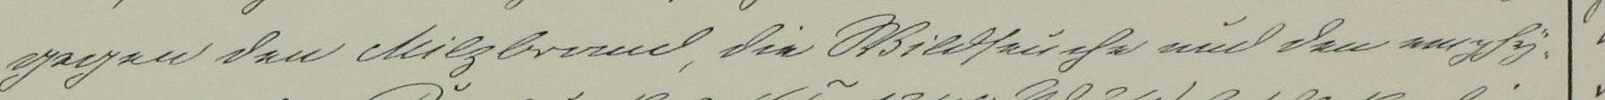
gegen den Milzbrand, die Wildseuche und den emphy-
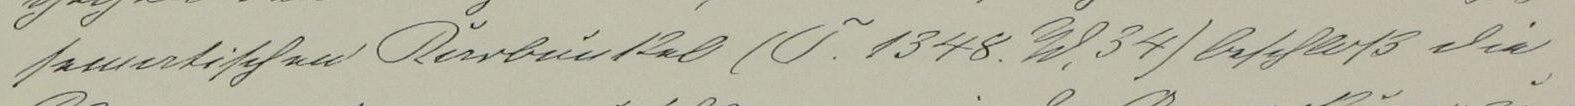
sematischen Karbunkel (T.1348. W.34) beschloß die
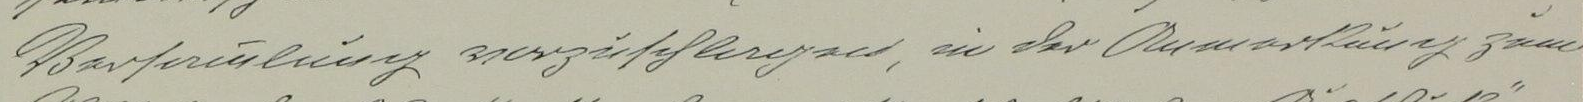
Versammlung vorzuschlagen, in der Anmerkung zum
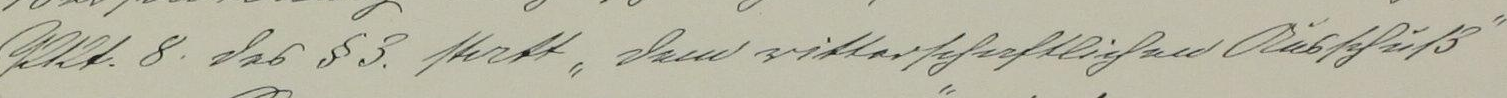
Pkt. 8 des §3. statt „dem ritterschaftlichen Ausschuß“
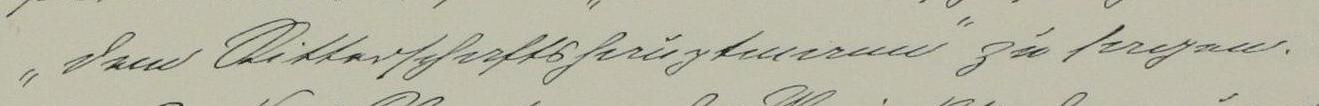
„dem Ritterschaftshauptmann“ zu sagen.
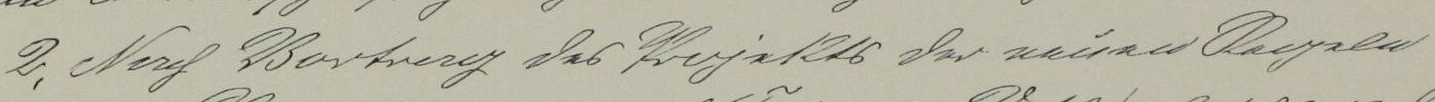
2. Nach Vortrag des Projekts der neuen Regeln
